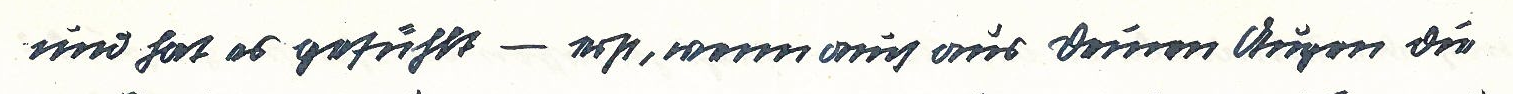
und hat es gefühlt – erst, wenn auch aus Deinen Augen die
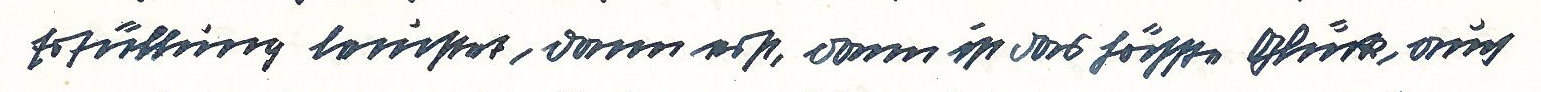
Erfüllung leuchtet, dann erst, dann ist das höchste Glück, auch
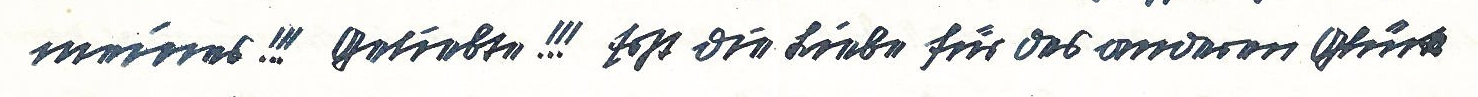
meines!!! Geliebte!!! Erst die Liebe für des anderen Glück
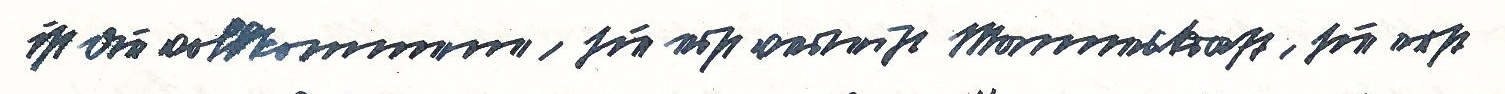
ist die vollkommene, sie erst verleiht Manneskraft, sie erst
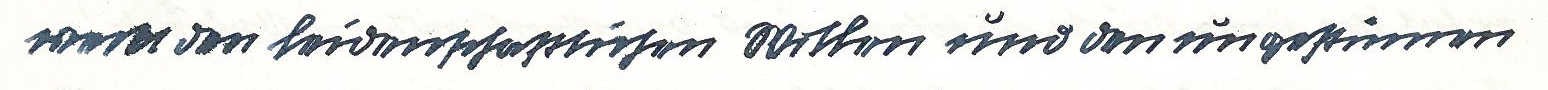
eckt den leidenschaftlichen Willen und den ungestümen
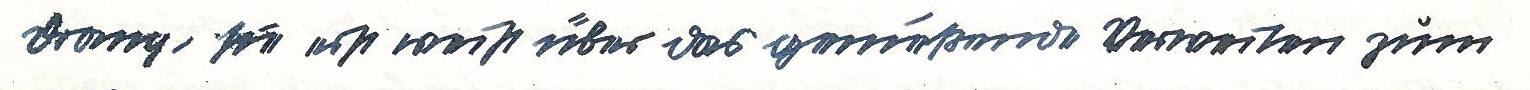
Drang, sie erst weiht über das genießende Verweilen zum
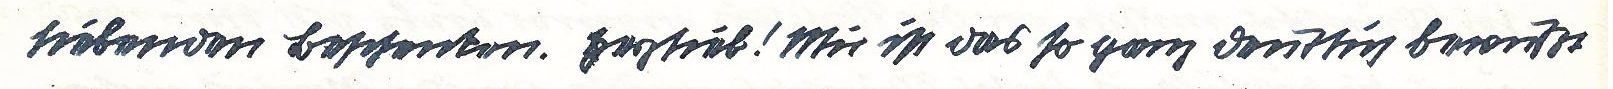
liebenden Beschenken. Herzlieb! Mir ist das so ganz deutlich bewußt
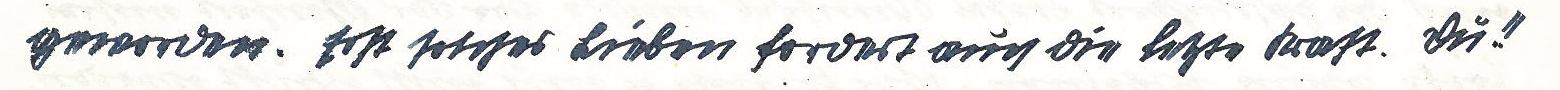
geworden. Erst solches Lieben fordert auch die letzte Kraft. Du!!
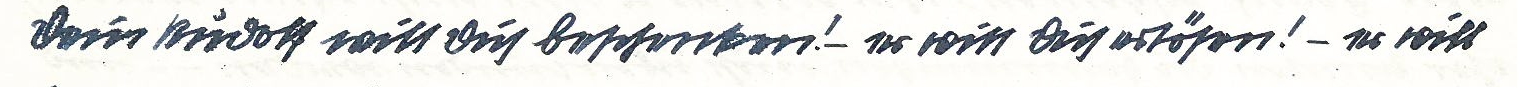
Dein Rudolf will Dich beschenken! – er will Dich erlösen! – er will
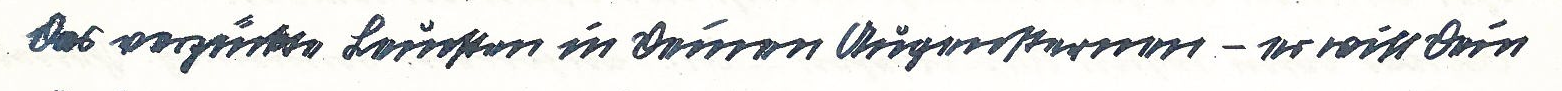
das entzückte Leuchten in Deinen Augensternen – er will Dein
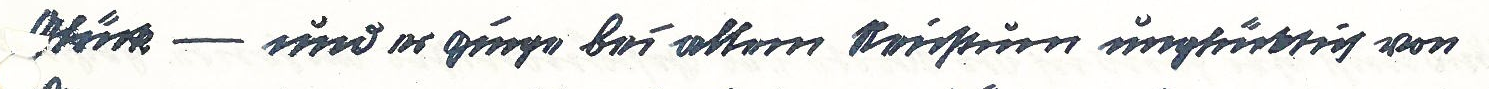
lück – und er ginge bei allem Reichtum unglücklich von
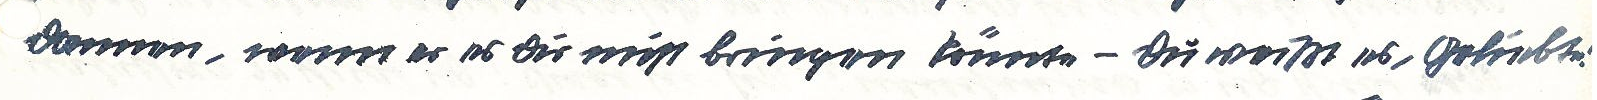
dannen, wenn er es Dir nicht bringen könnte – Du weißt es, Geliebte!
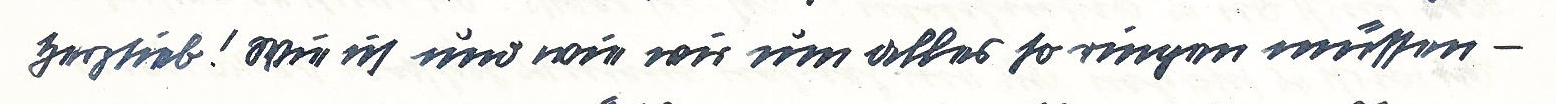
Herzlieb! Wie ich und wie wir um alles so ringen müssen –
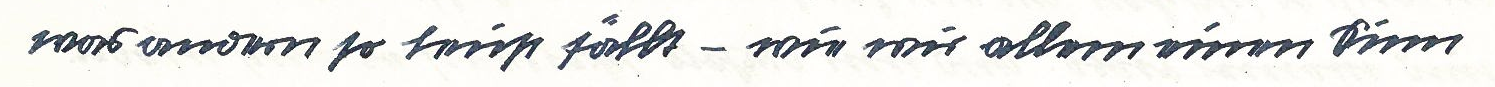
was andern so leicht fällt – wie wir allem einen Sinn
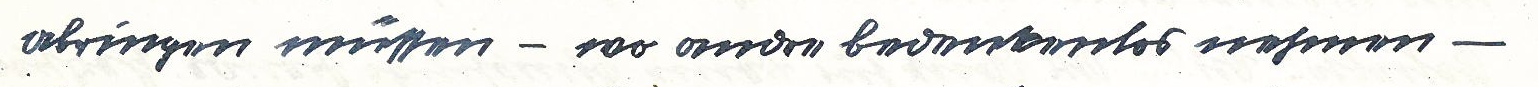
abringen müssen – wo andere bedenkenlos nehmen –
